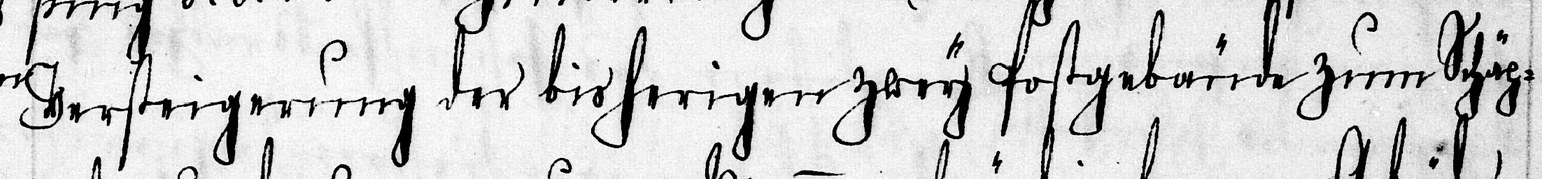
Versteigerung der bisherigen zwey Postgebäude zum Schäp¬
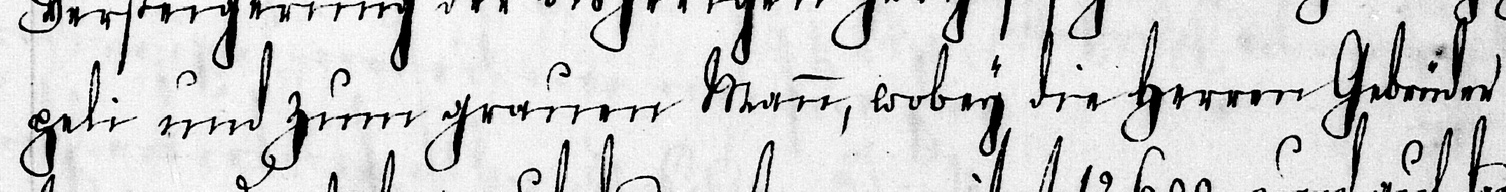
peli und zum grauen Mann, wobey die Herren Gebrüder
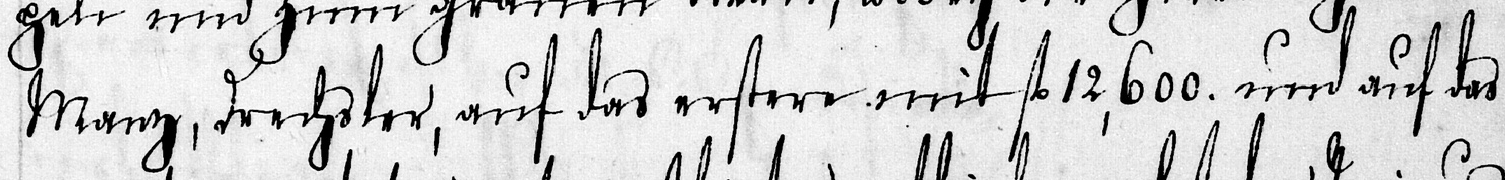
Manz, Drechsler, auf das erstere mit fl 12'600. und auf das
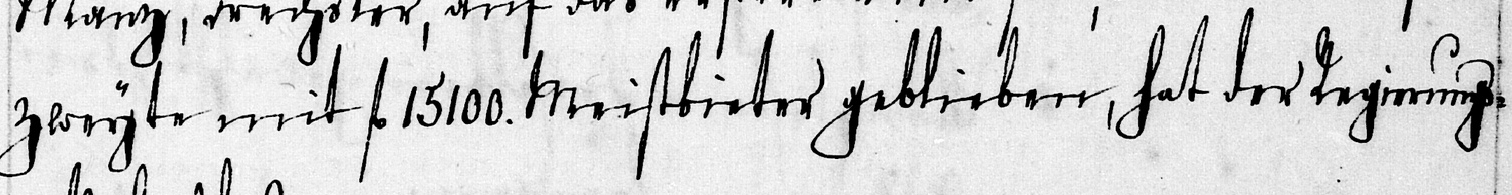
zweyte mit fl 15100. Meistbieter geblieben, hat der Regierung¬
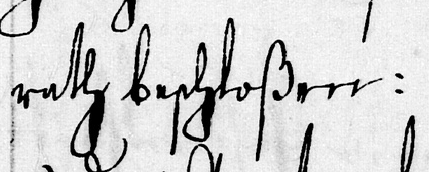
ath beschloßen:
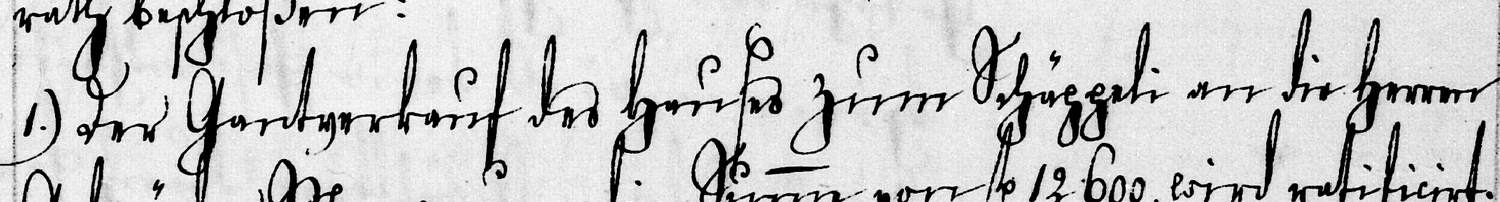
1.) Der Gantverkauf des Hauses zum Schäppeli an die Herren
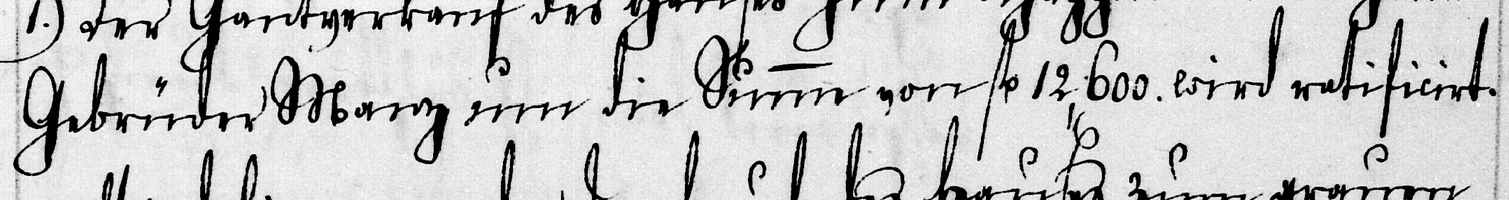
Gebrüder Manz um die Summe von fl 12'600. wird ratificirt.
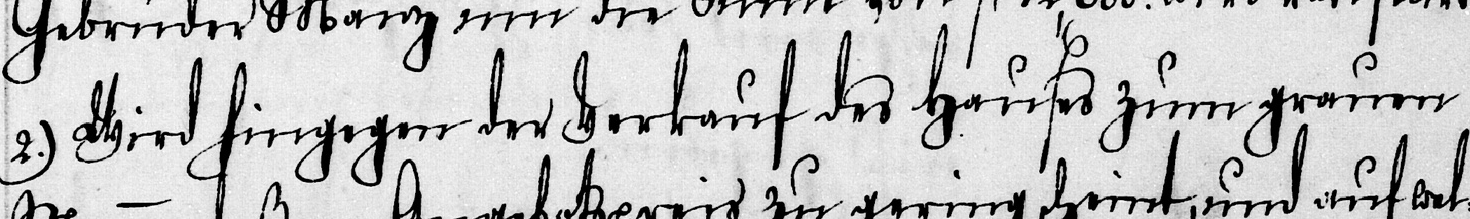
2.) Wird hingegen der Verkauf des Hauses zum grauen
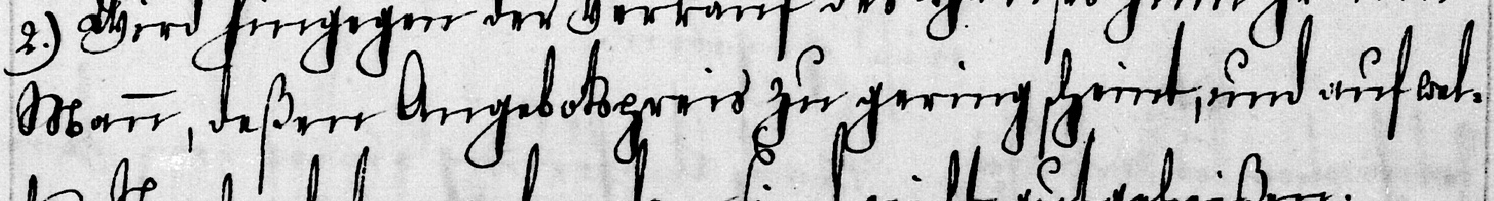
Mann, deßen Angebotspreis zu gering scheint, und auf wel¬
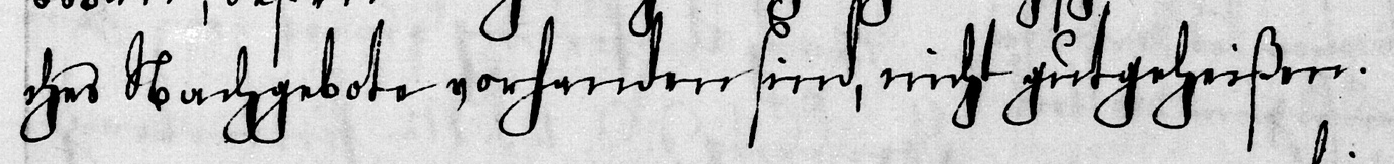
ches Nachgebote vorhanden sind, nicht gutgeheißen.
